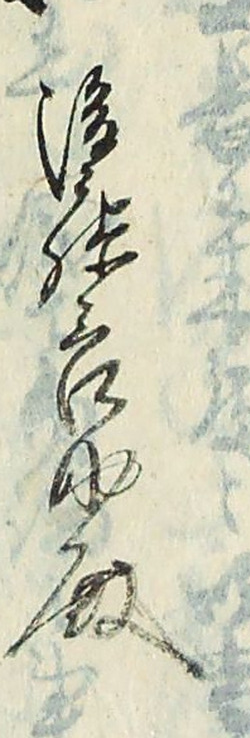後藤善助殿
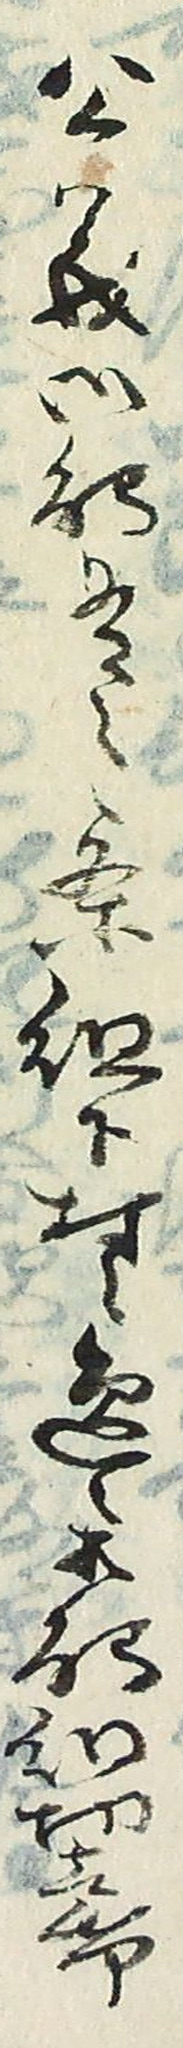公義御触有之候条組下村々逸々相触組切壱帋
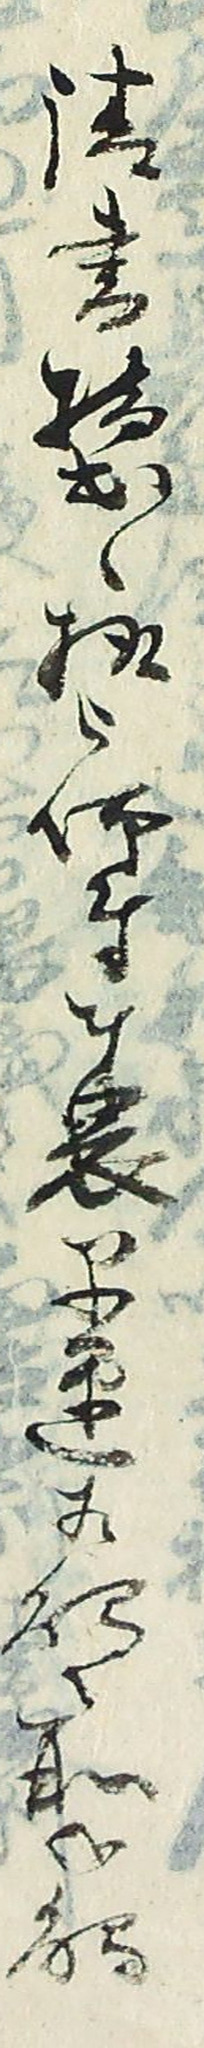請書指出候様被仰付奉畏早速相触候所御触
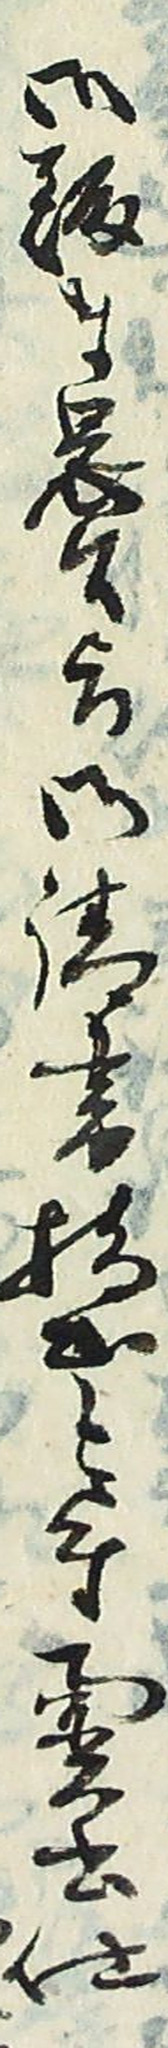御趣奉畏旨御請書指出候に付奥書仕
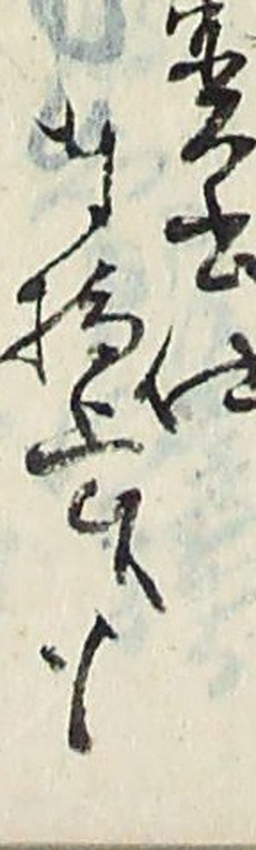奉指上候以上
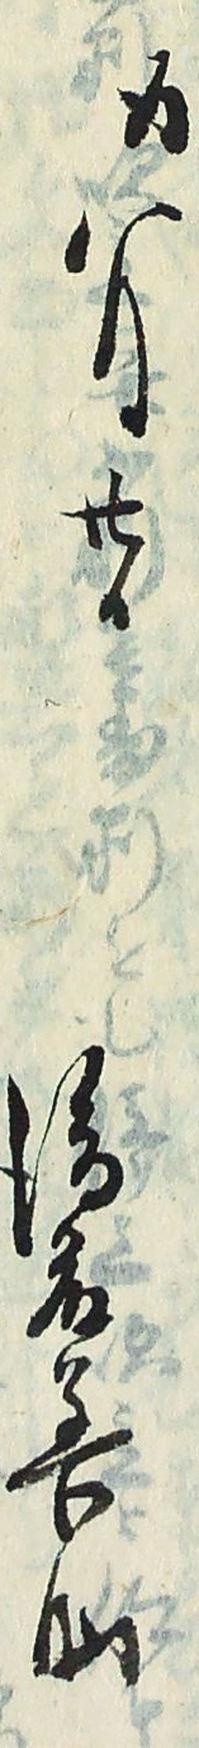酉八月廿日後藤善助
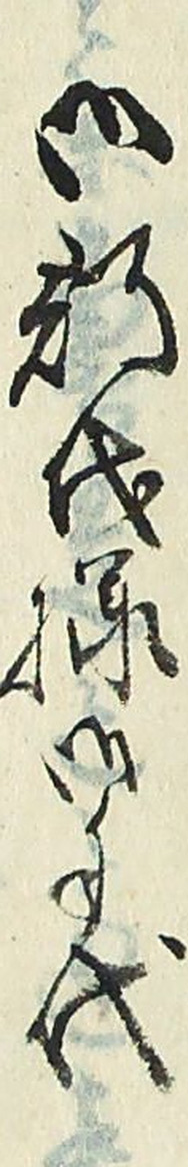御郡代様御手代
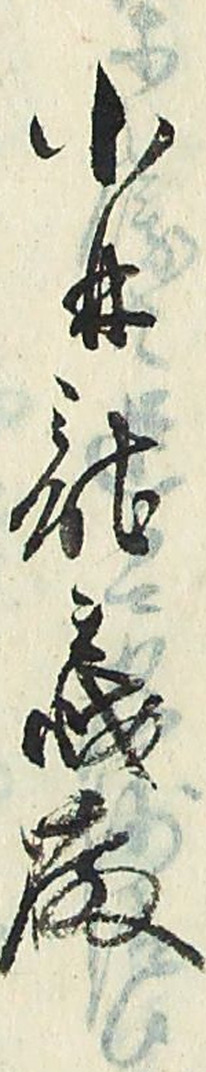小林龍蔵殿

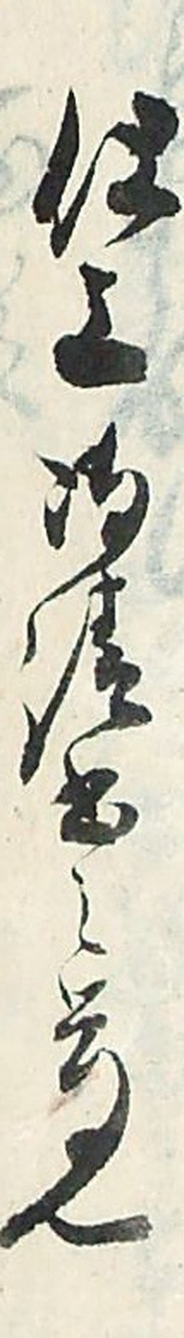仕上御請書之覚
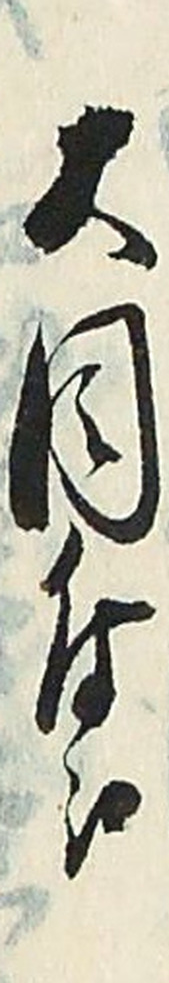大目付江
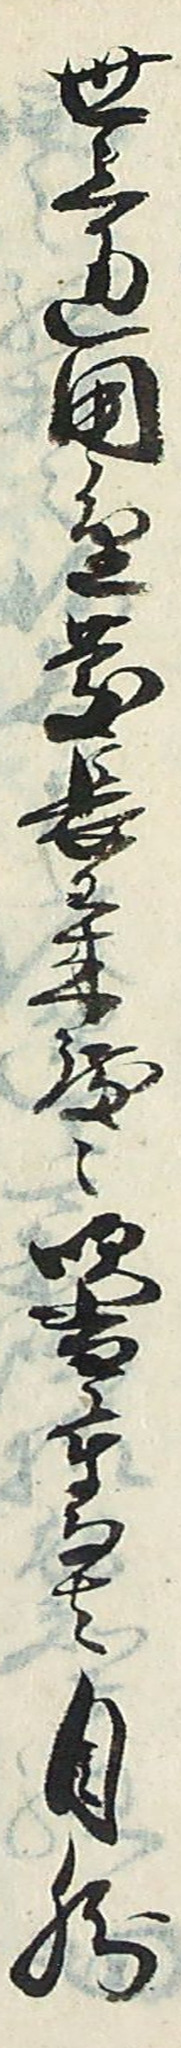世上通用金慶長已来度々吹替えに付而は自然
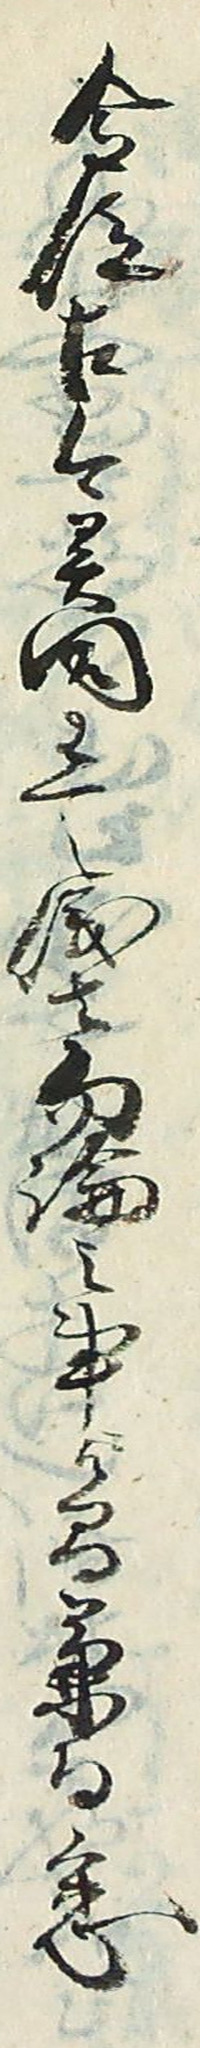金位古今異同有之之儀は勿論之事に候間兼而悉
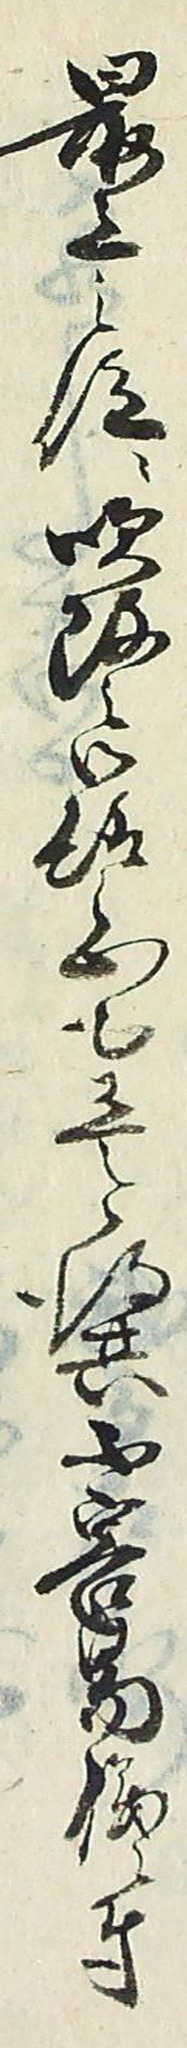最上位之位に吹改之御趣意も有之候得共不容易儀に付
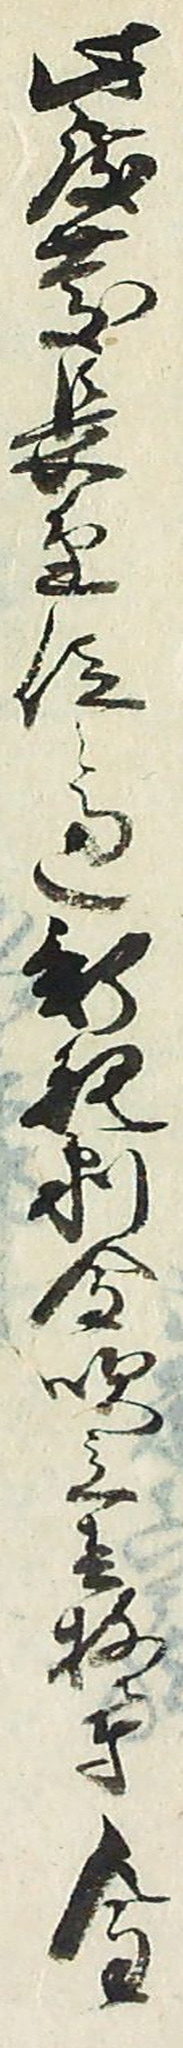此度慶長金位之通新規判金吹立壱枚に付金
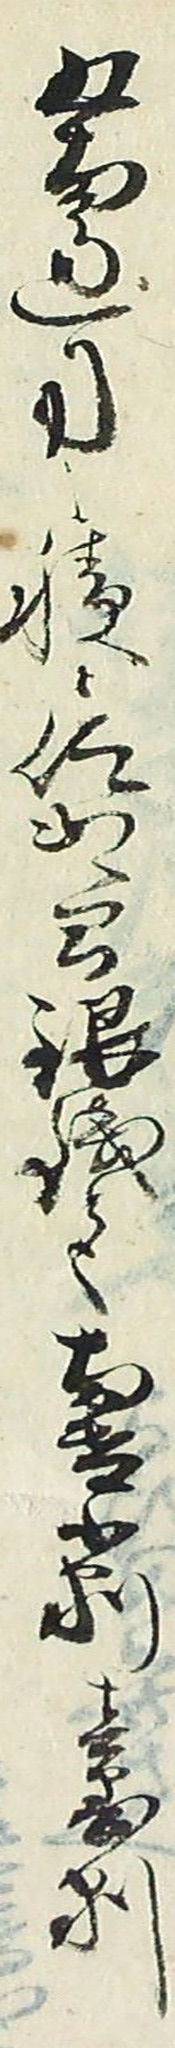五両通用之積被仰付候間銀銭とも両替小判壱歩判
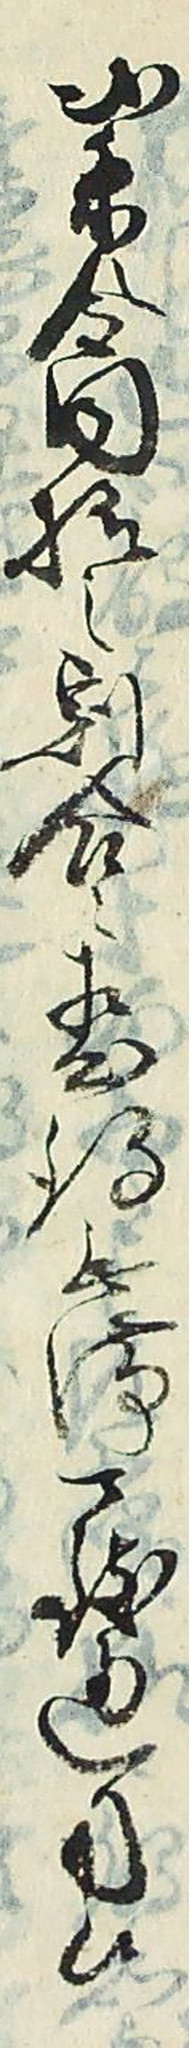二朱金同様之割合に相心得無滞可致通用候
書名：諸御用御□受書控
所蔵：鳴門教育大学 Naruto University of Education
